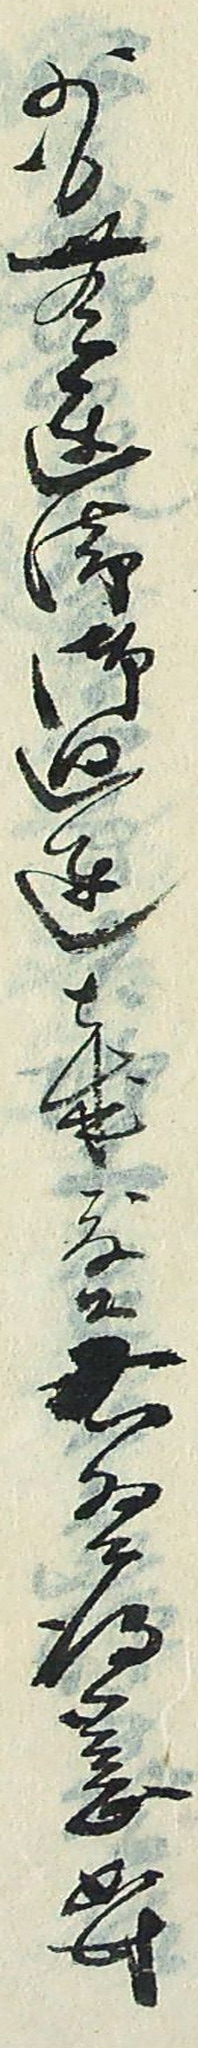少も無遅滞御廻達被成度候右為可得御意如此
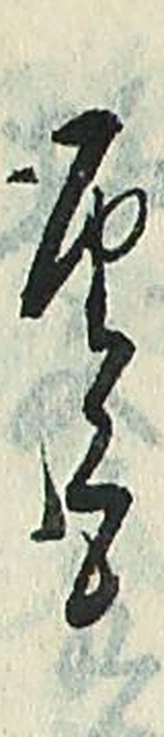御座候以上
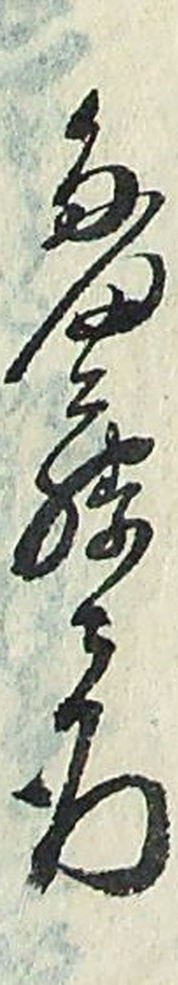多田藤右衛門
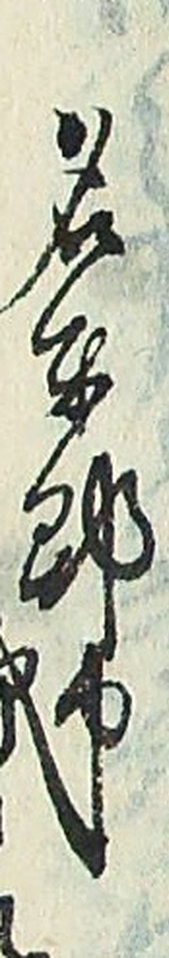名東郡中
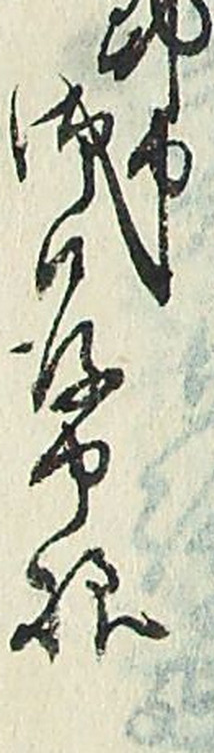御同役中様

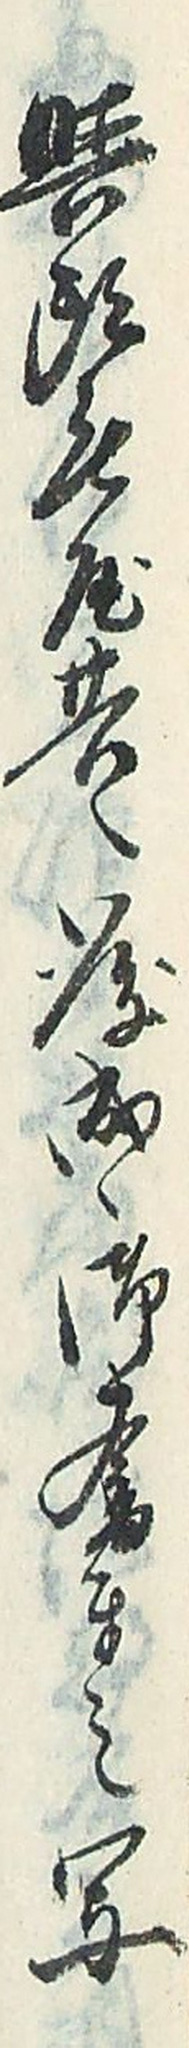與頭庄屋共へ御渡成候御書付之写
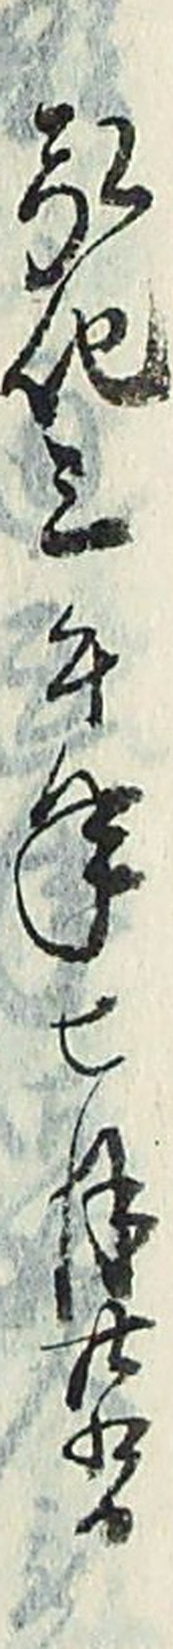弘化三午年七月廿九日
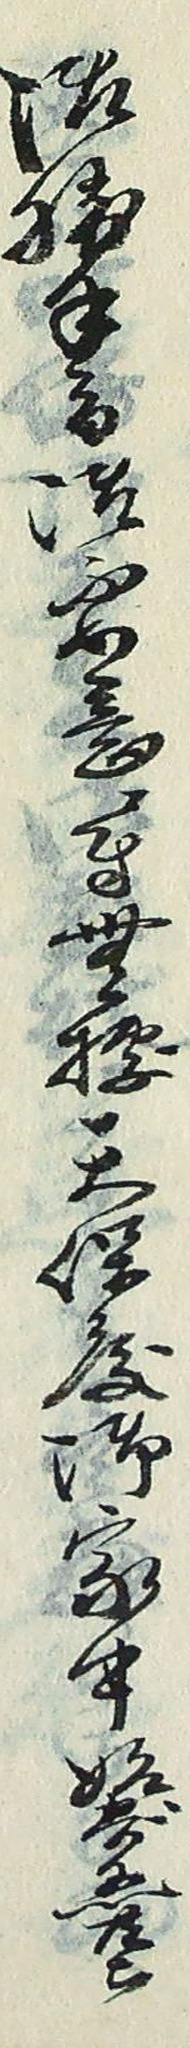御勝手方御不如意ニ付無據天保度御家中始歩懸共も被
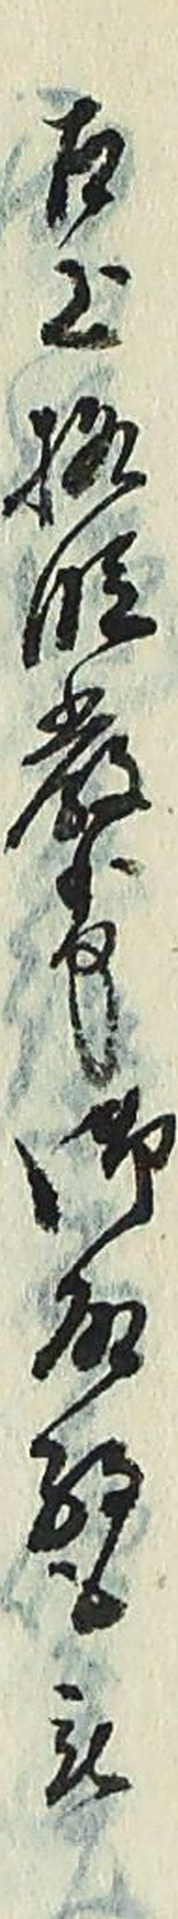召上格段厳布御取約も被
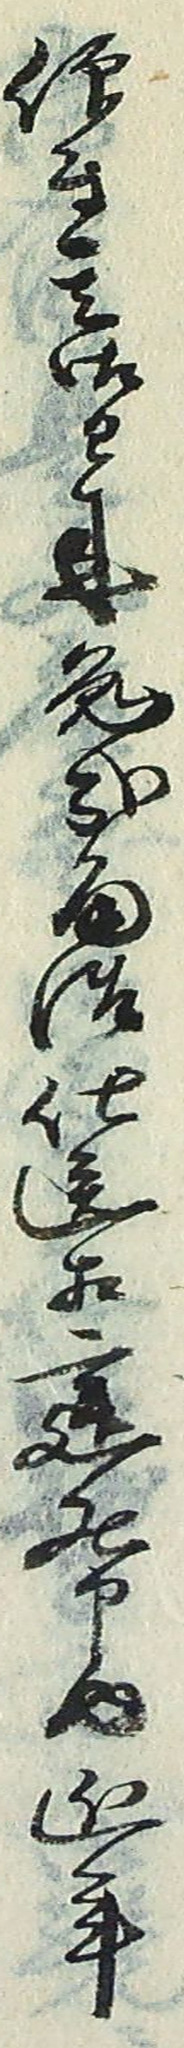仰付其御已来兎哉角御仕送相建居申内近年
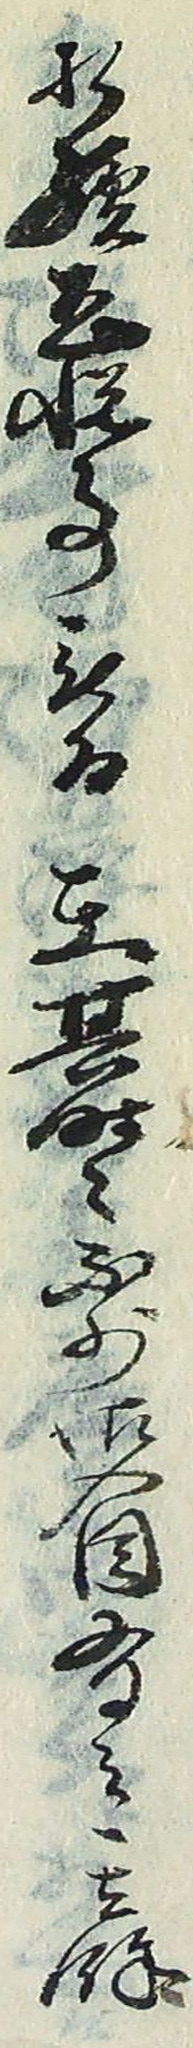打續恐悦事被為在其時々不少御入目有之其餘
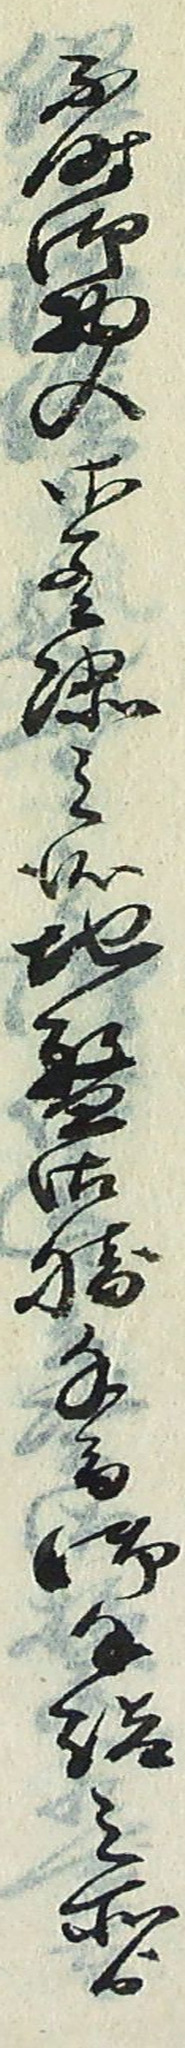不時御物入御差添之所地盤御勝手方御手詰之所ゟ
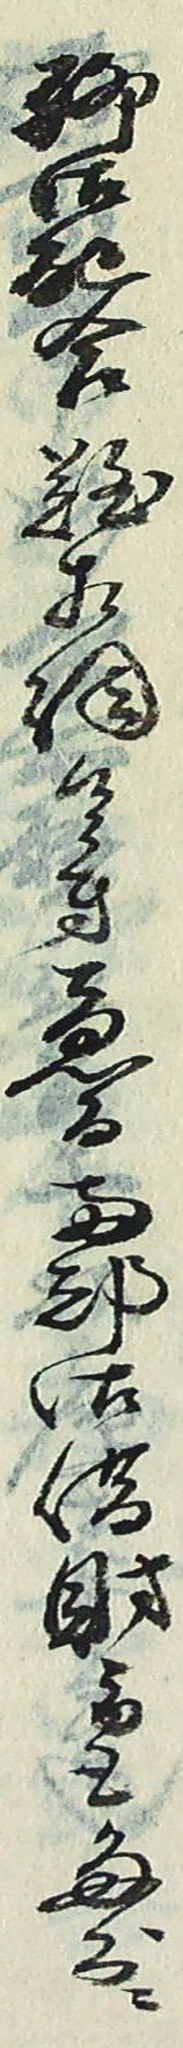聊御配合難相調候ニ付兼而両都御借財方も多分ニ
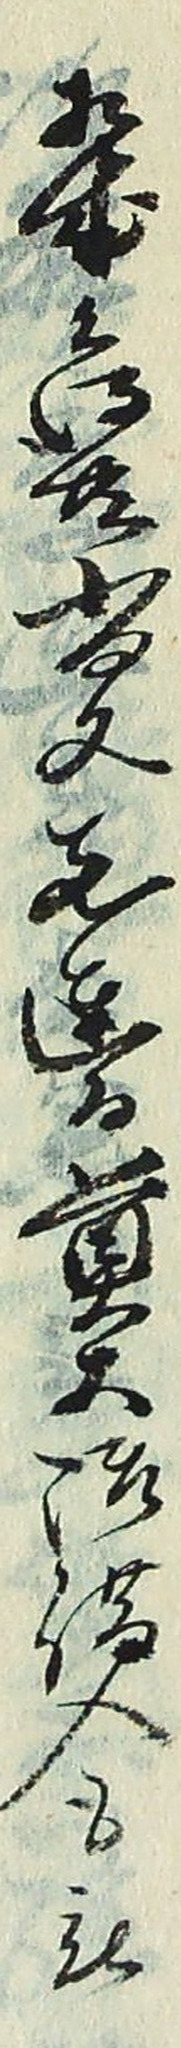相成候得共尚又先達而莫大御借入も被
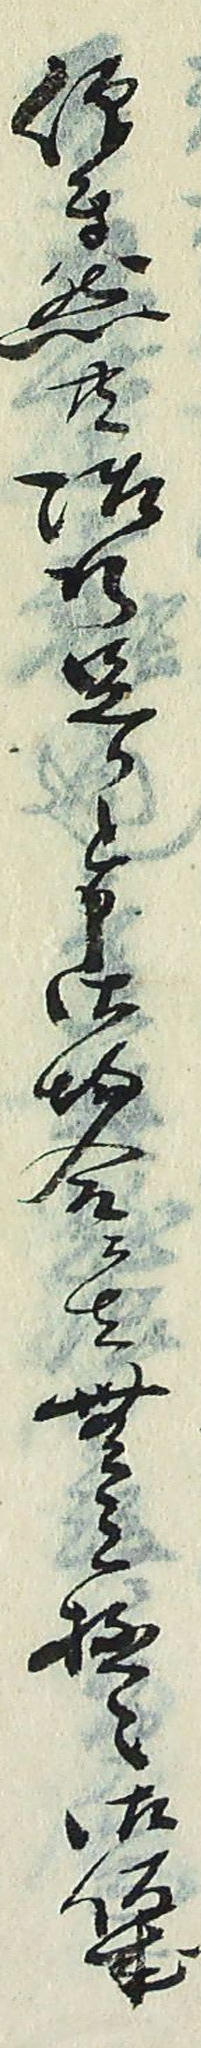仰付然共御行足りと申御場合ニ者無之極々御仮成
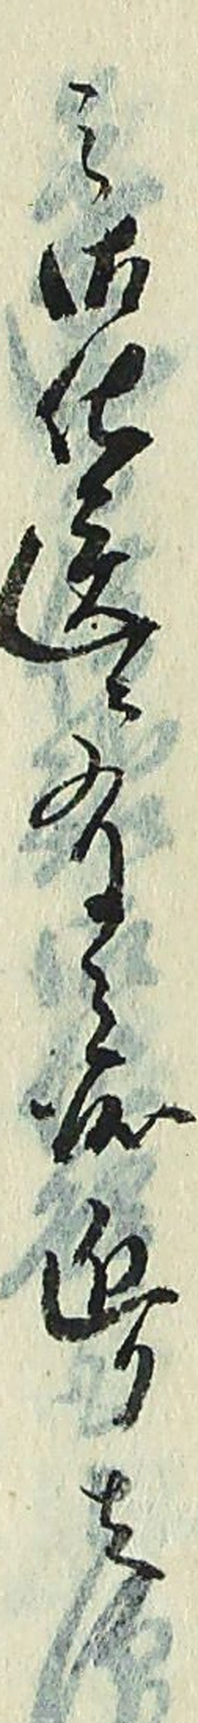之御仕送ニ有之所近く者
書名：諸御趣意書并御下知向之写
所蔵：鳴門教育大学 Naruto University of Education
